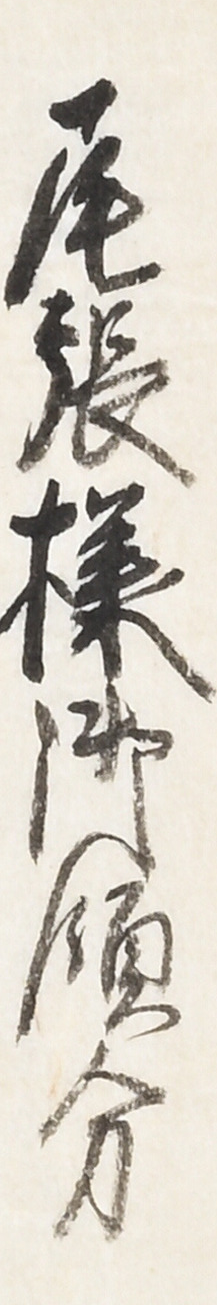尾張様御領分
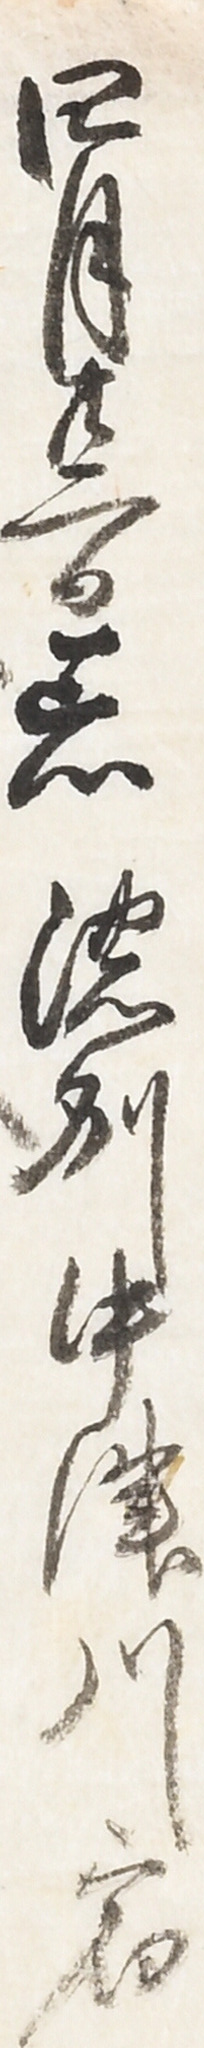四月廿ニ日着濃州中津川宿
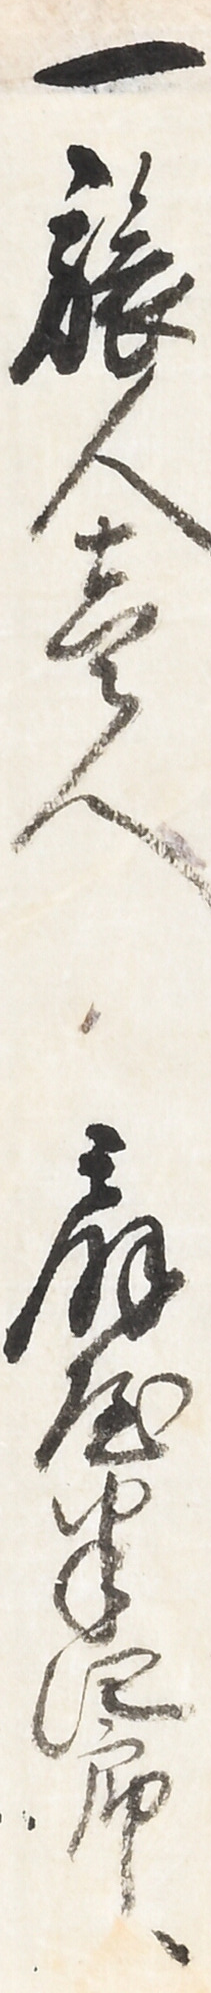一旅人壱人扇屋半四郎、
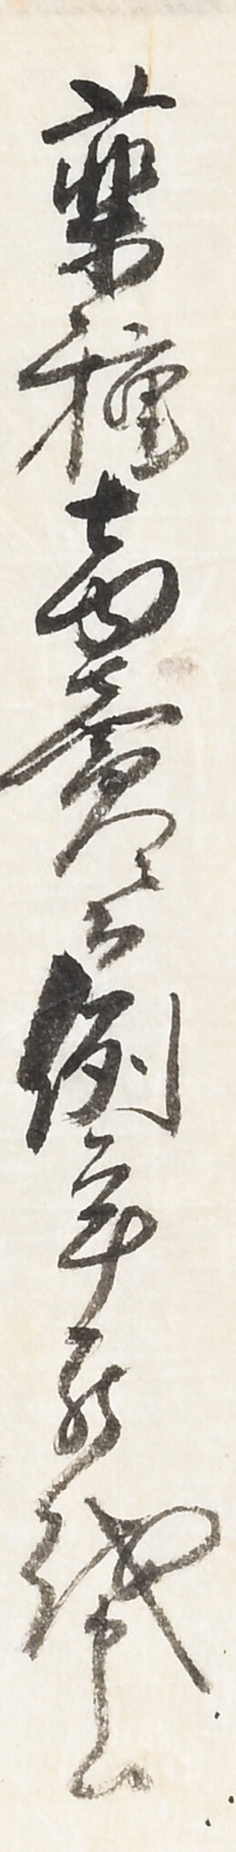薬種商売ニ而例年罷越申候
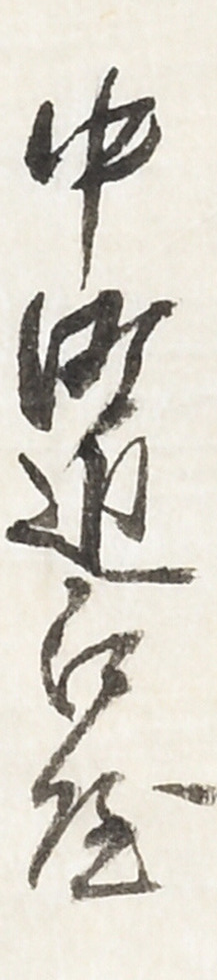中町近江屋
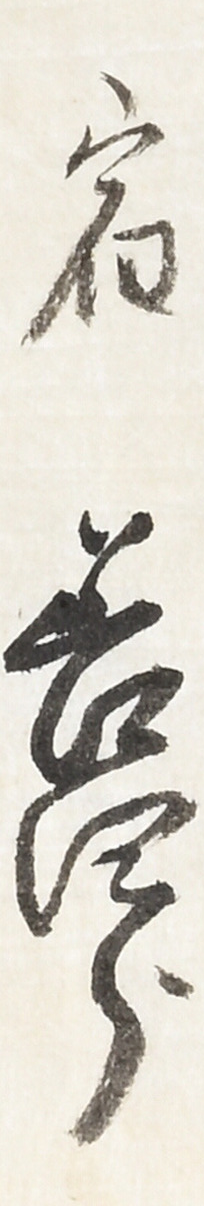宿善四郎
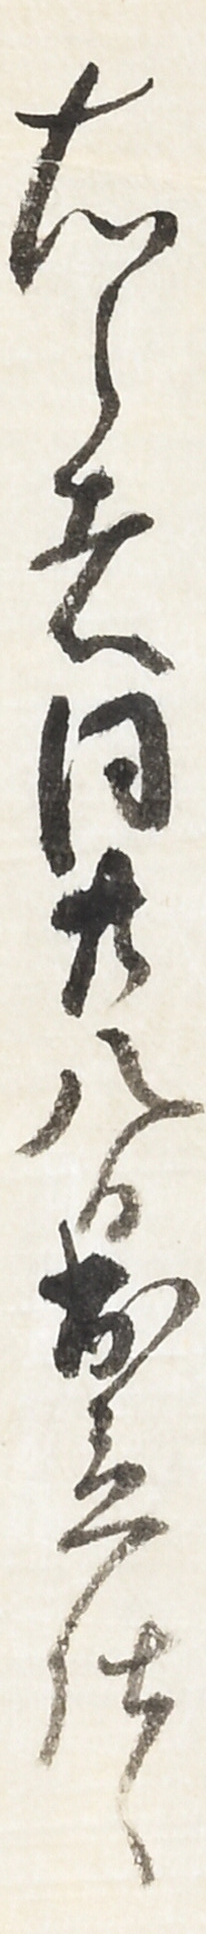右之者同廿鉢日出立仕候
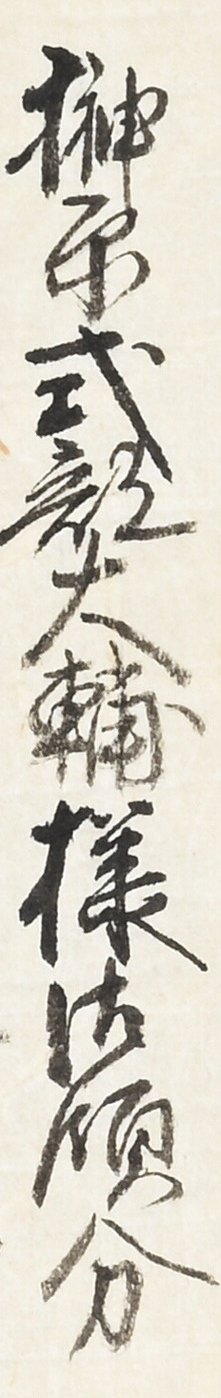榊原式部大輔様御領分
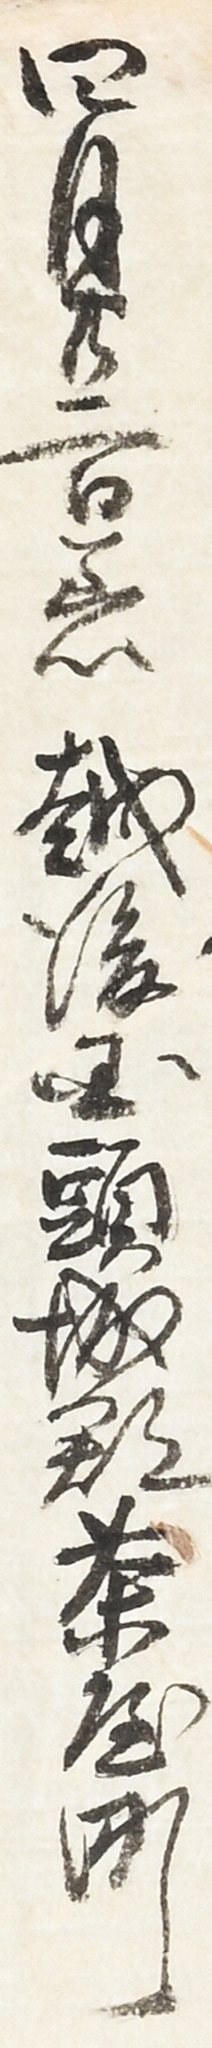四月廿ニ日着越後国頸城郡茶屋町
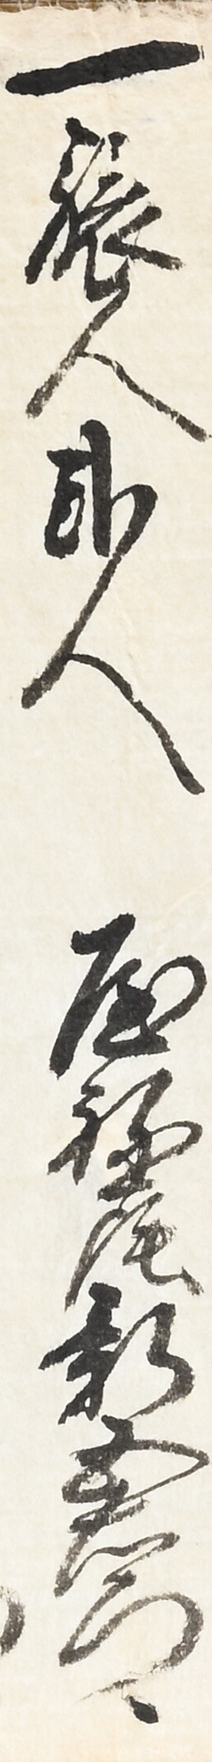一旅人弐人屋祢屋新五右衛門・
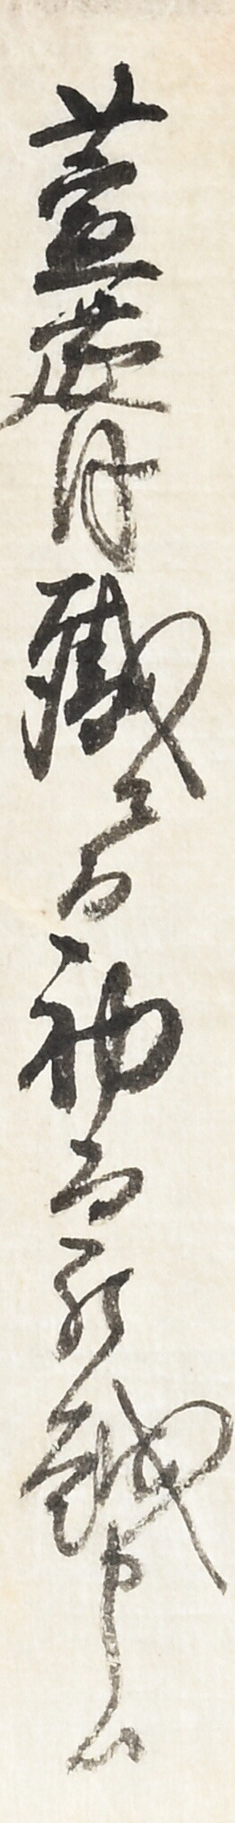萱莚月職ニ而初而罷越申候

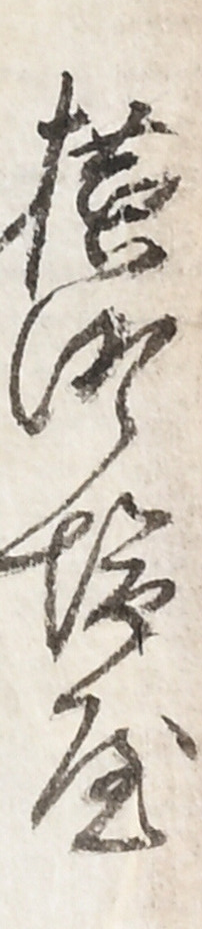横町塩屋
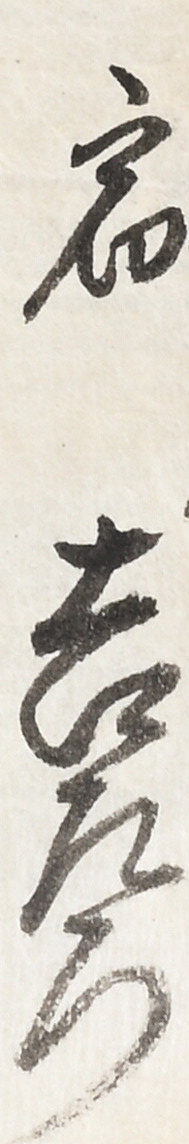宿吉左衛門
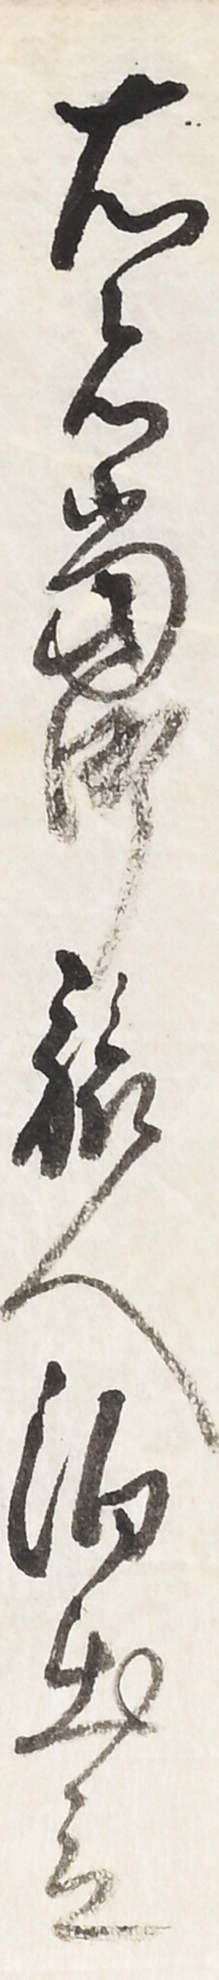右者当町旅人泊出立
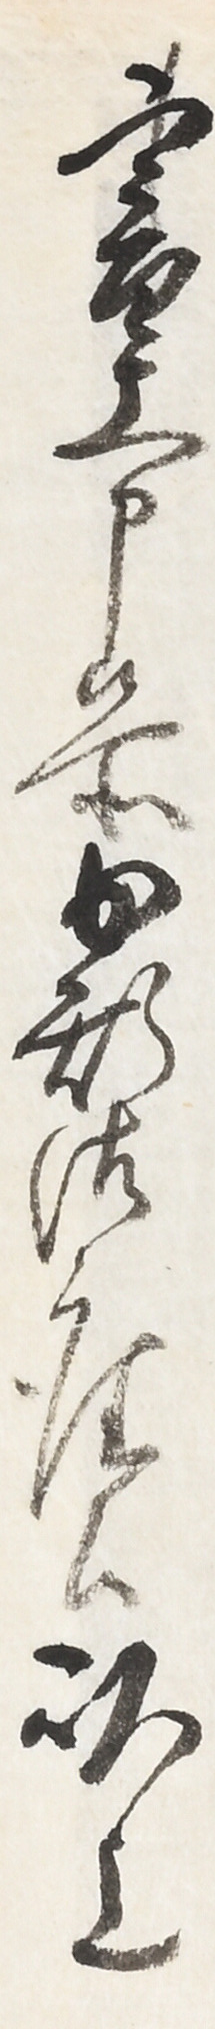書上申候処如斯御座候以上
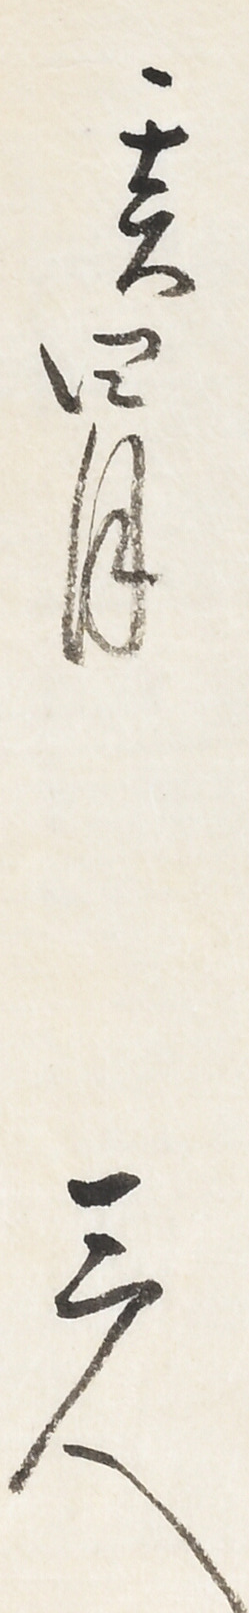亥四月三人
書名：旅人泊控帳
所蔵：伊那市立高遠町図書館・合同会社AMANE
